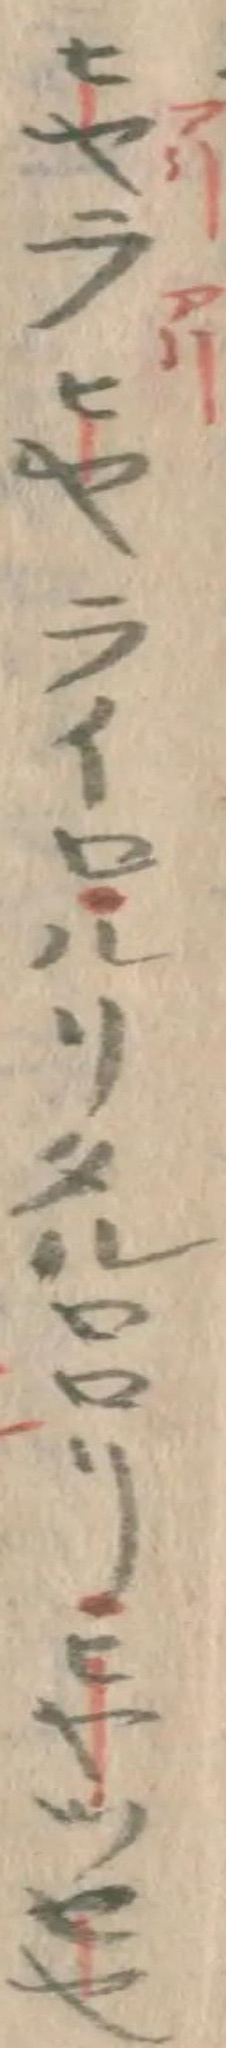ヒ-ヤラヒ-ヤライロ・ルリタルロロリ・ヒ-ヤ-ツヒ-ヤ
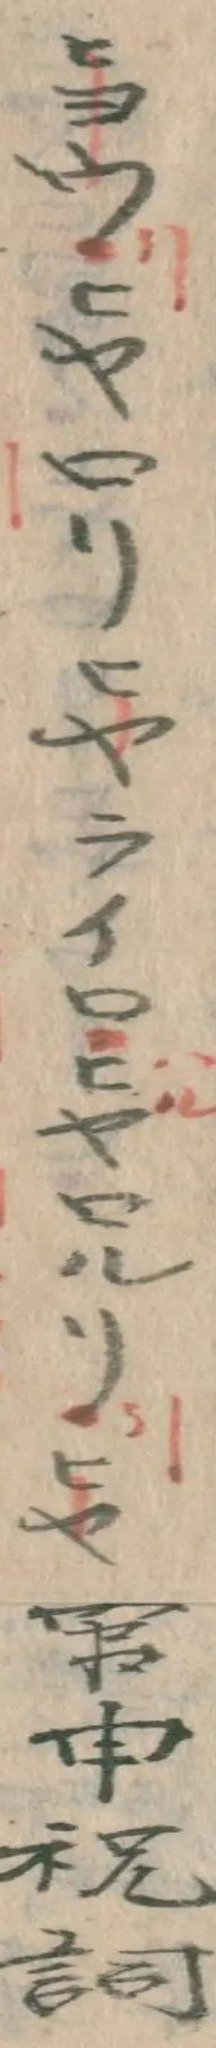ヒ-ヨ-ウ・ヒヤロリヒ-ヤライロ・ヒヤロルリ・ヒ-ヤ-ヒ-ヤヒ-
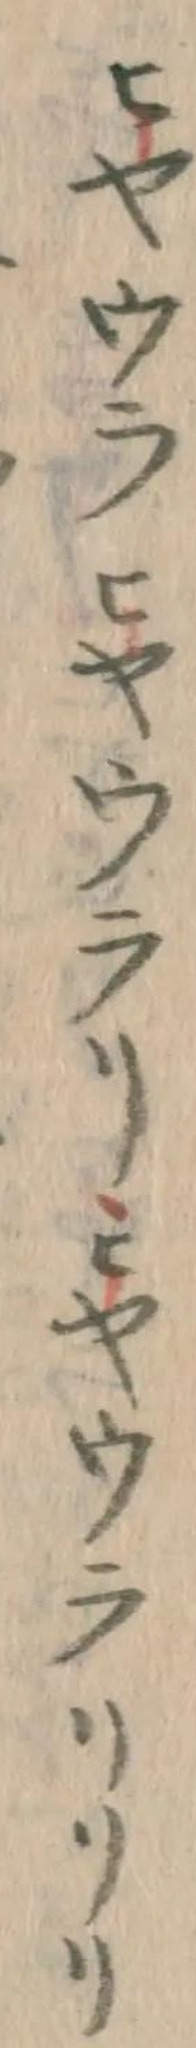ヒ-ヤウラヒ-ヤウラリヽヒ-ヤウラリリリ
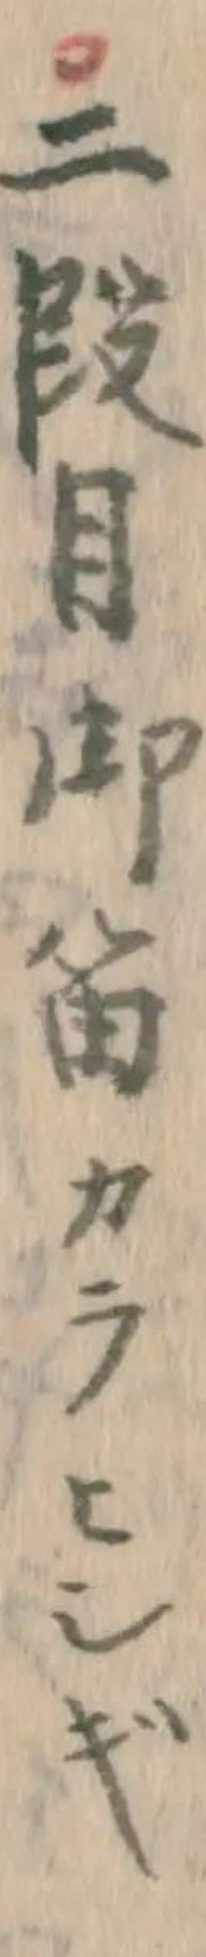◦二段目御笛カラヒシギ
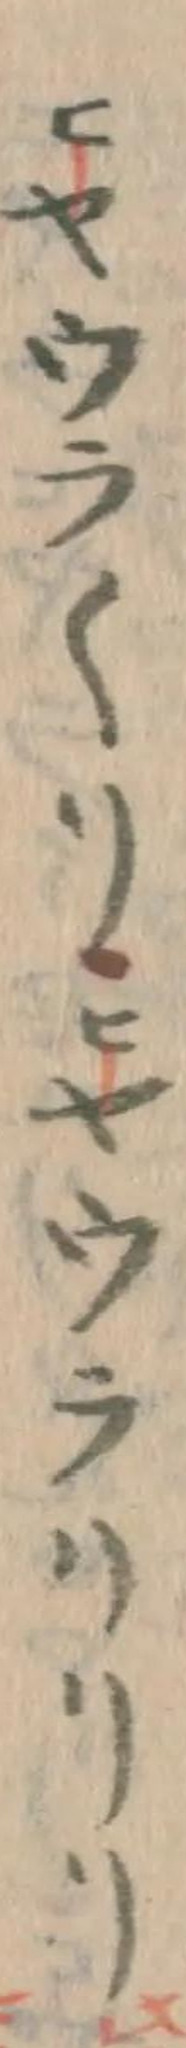ヒヤウラ〳〵リヒヤウラリリリ
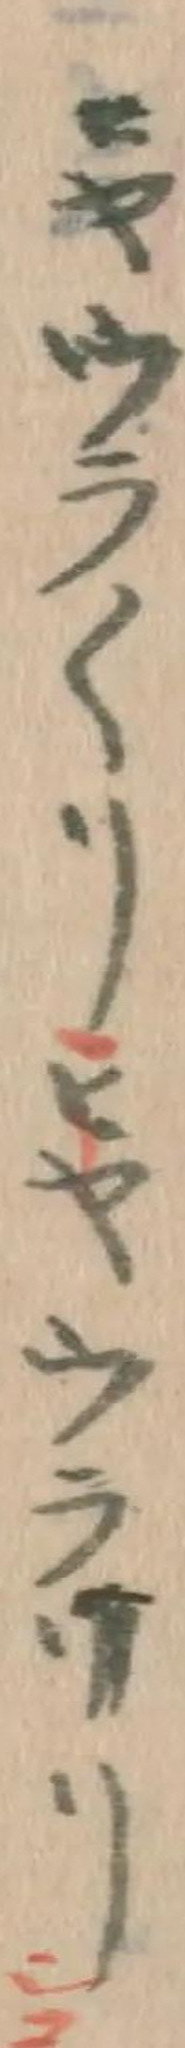ヒヤウラ〳〵リヒヤウラリリリ
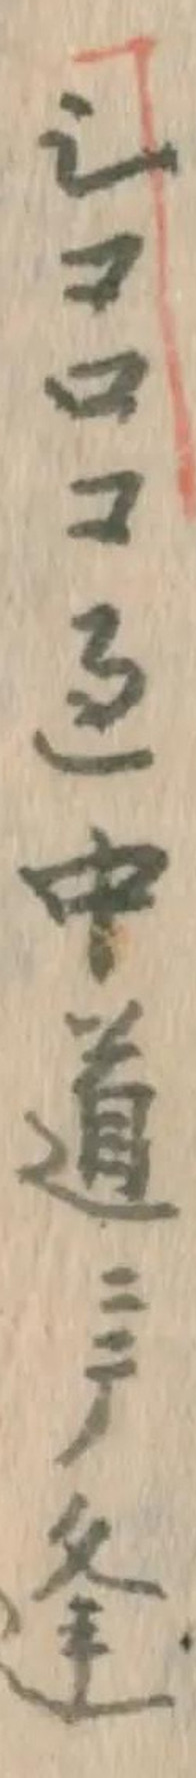〽シコロコ過中道ニテ逢
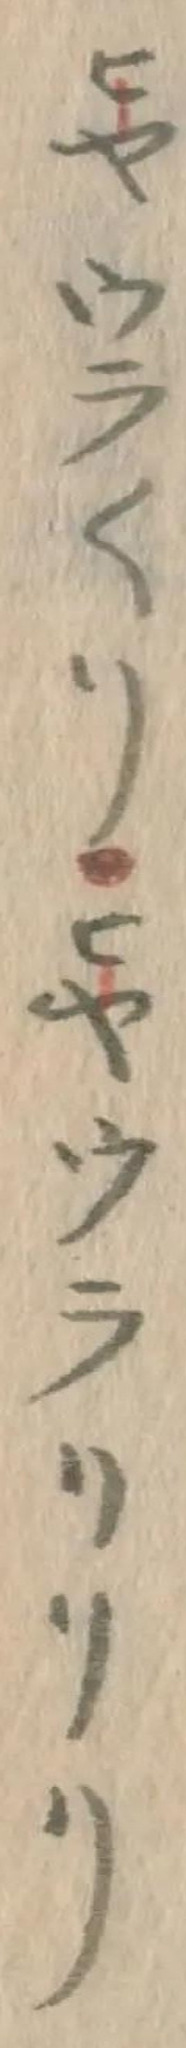ヒヤウラ〳〵リヒヤウラリリリ
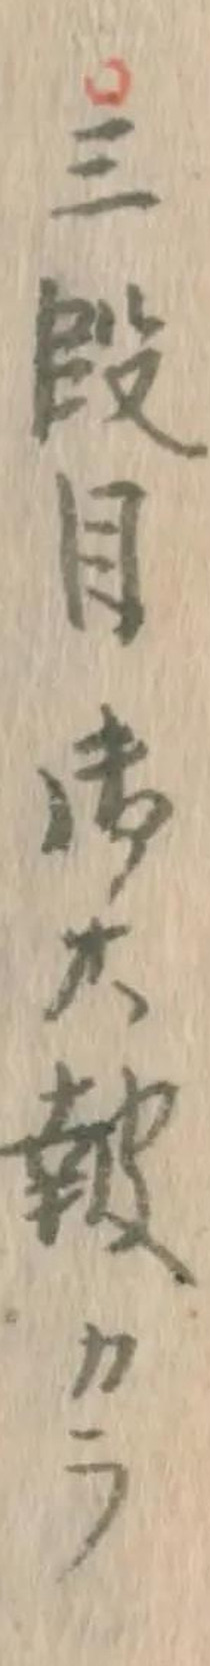◦三段目御大鼓カラ
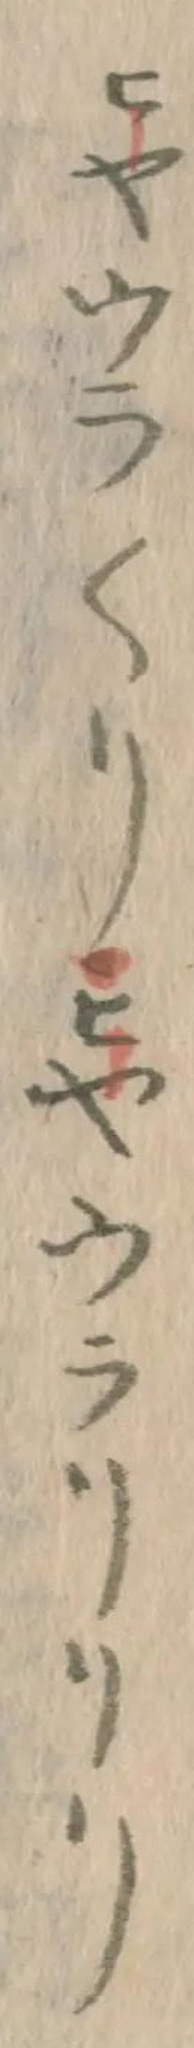ヒヤウラ〳〵リヒヤウラリリリ
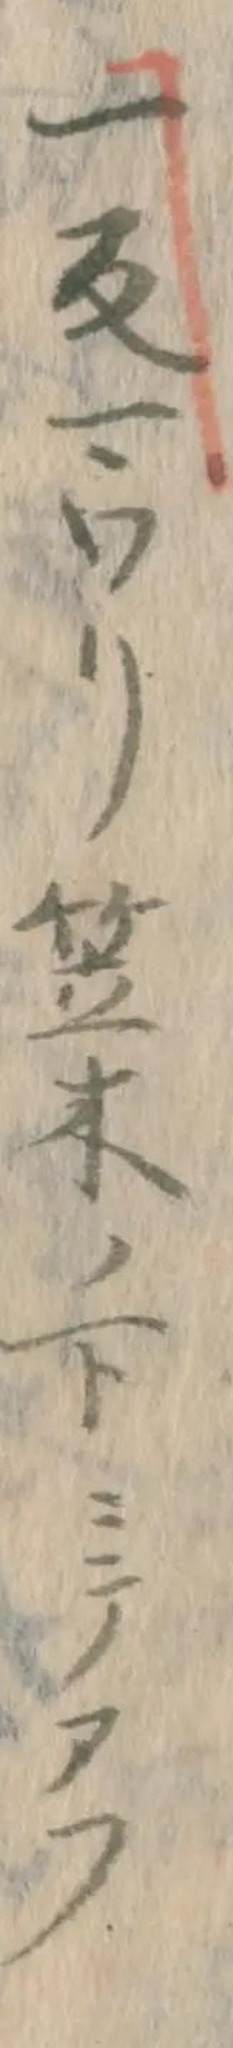〽一反マワリ笠木ノ下ニテアフ
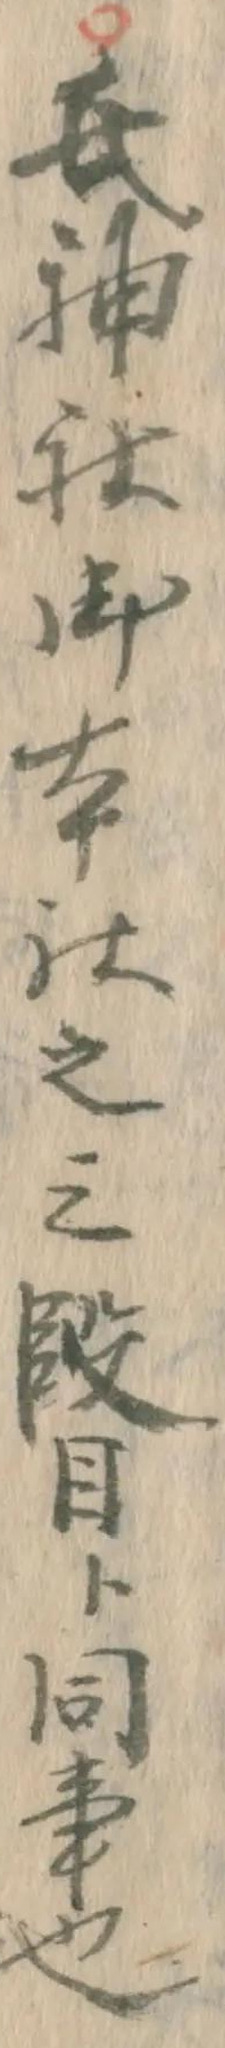◦氏神社御本社之三段目ト同事也
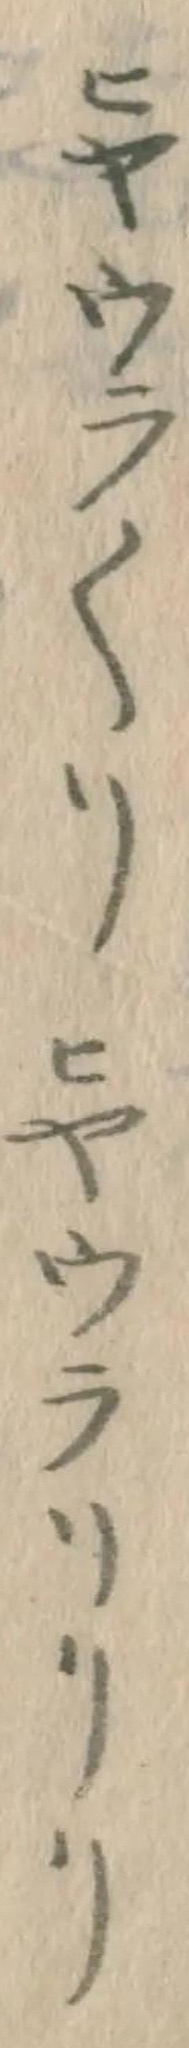ヒヤウラ〳〵リヒヤウラリリリ
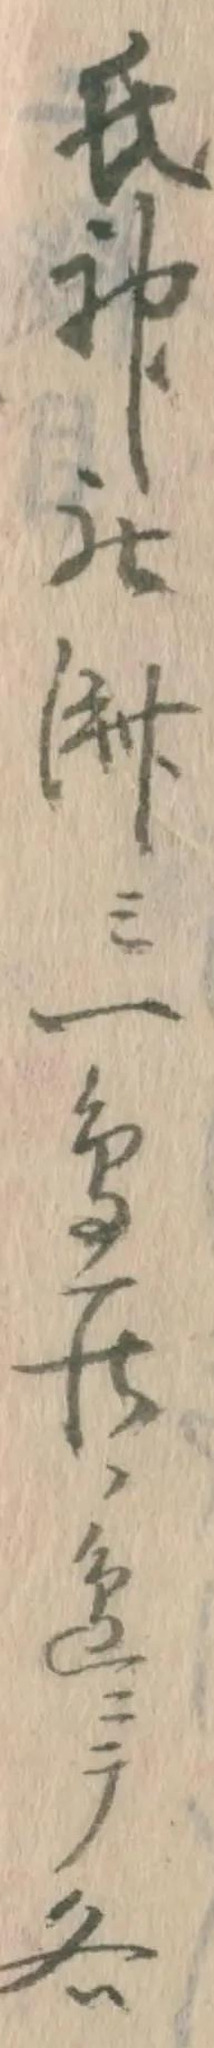氏神社済ミ一鳥居ノ辺ニテ各
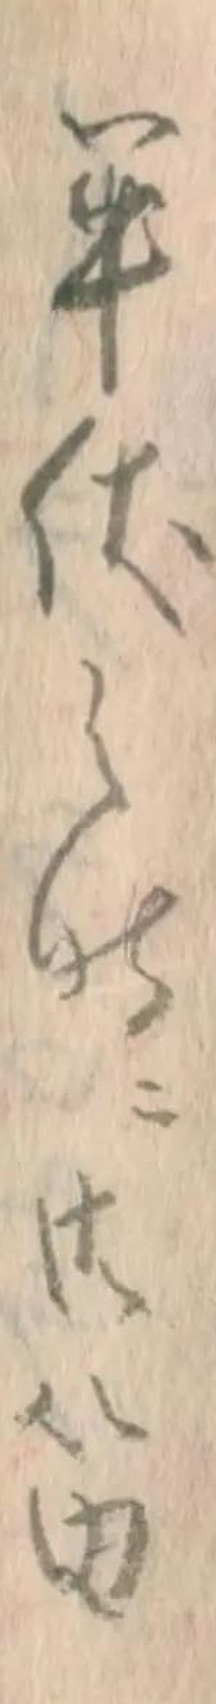平伏之時ニ御笛
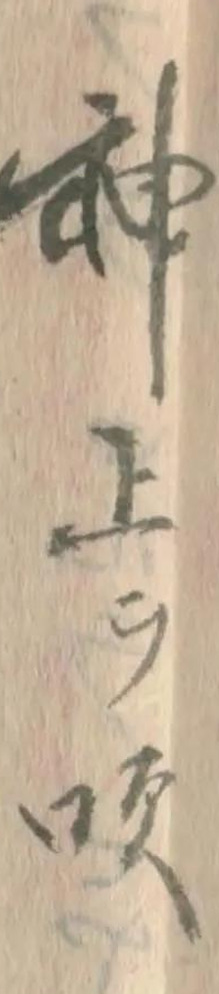神上ヲ吹
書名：賀茂社記録. 第9冊
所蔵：国立国会図書館 National Diet Library, JAPAN
